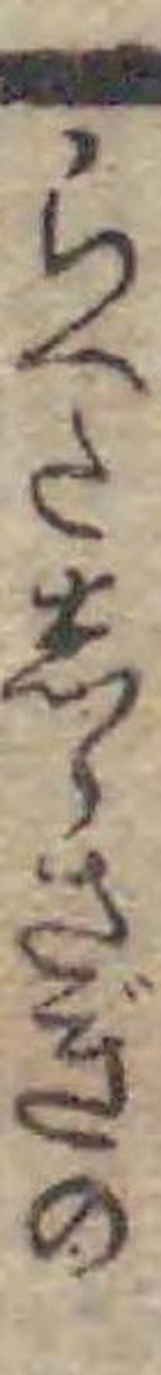らへたしらさぎの
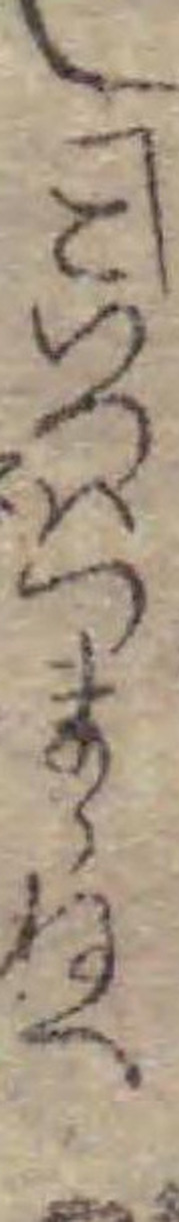〽こいつはつまらねへ
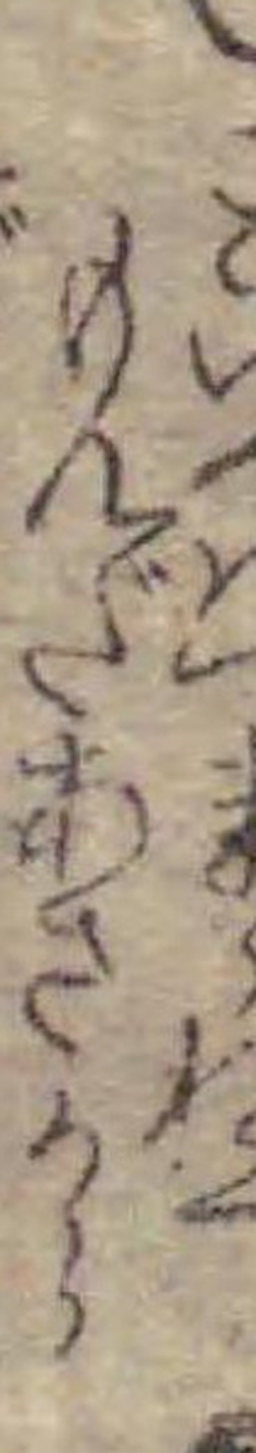もんだあさから
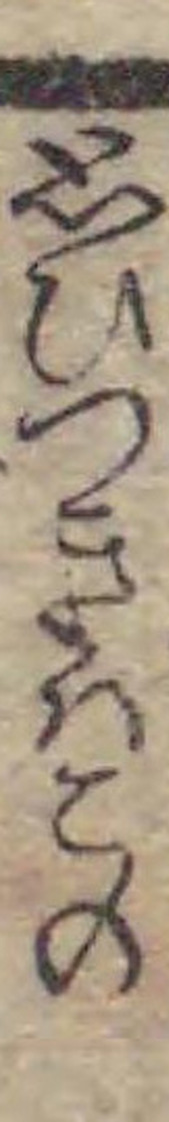思ひつきはこの
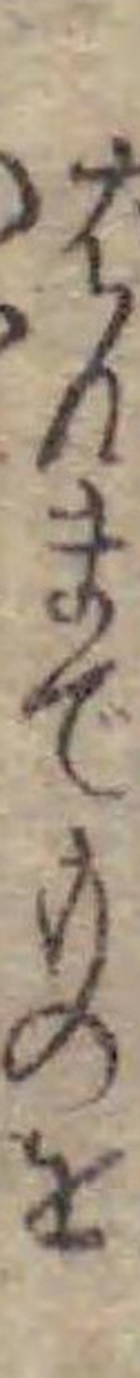ばんまでものを
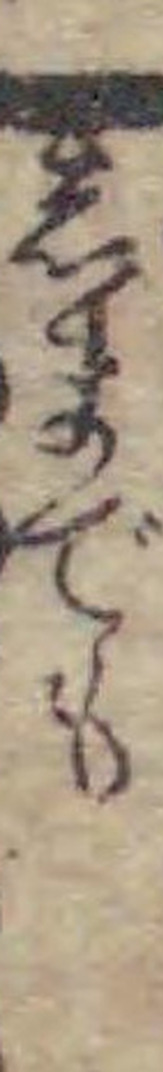しまでも
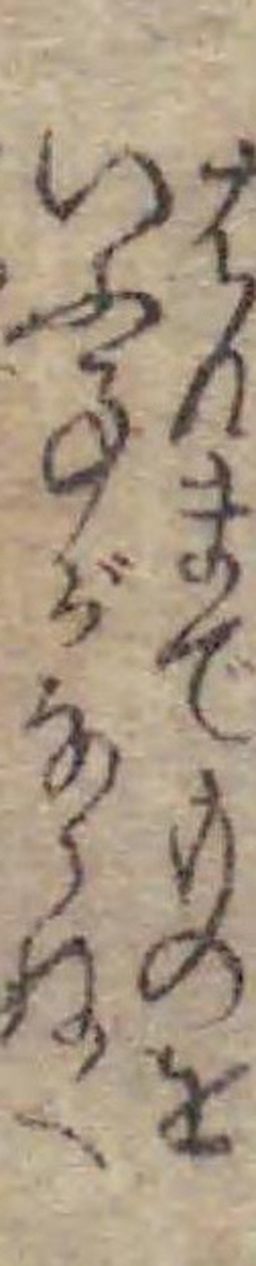いふ事がならねへ
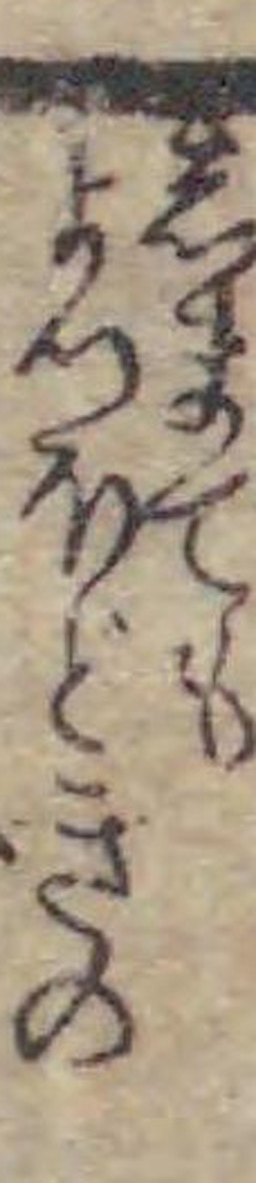よつほどきの
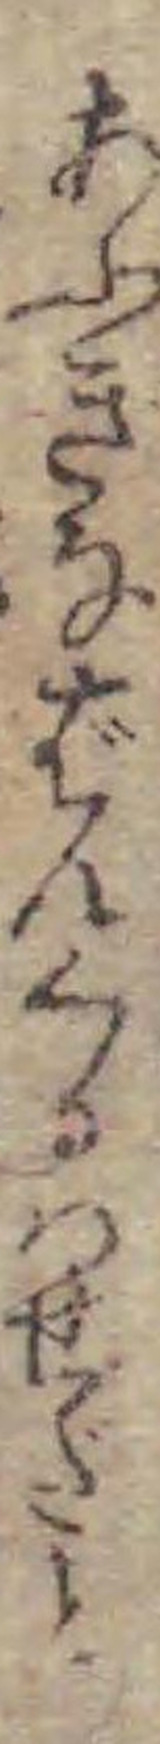あふきなばんくるはせだと
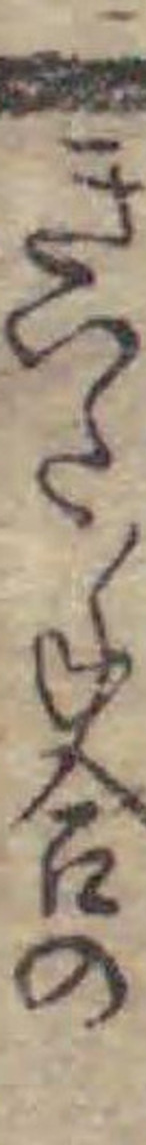きいた手合の
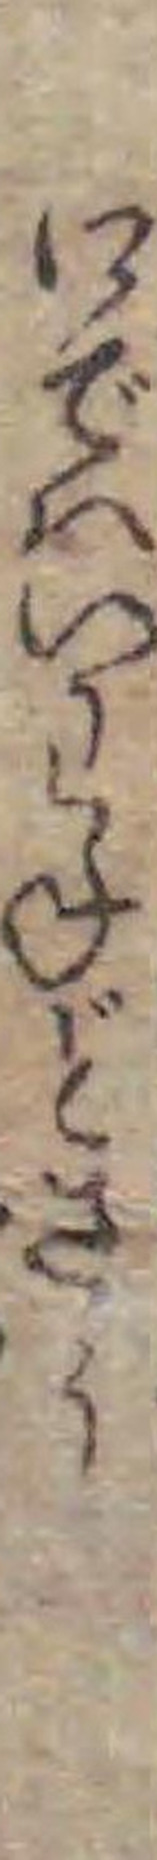口ではいわねどさう
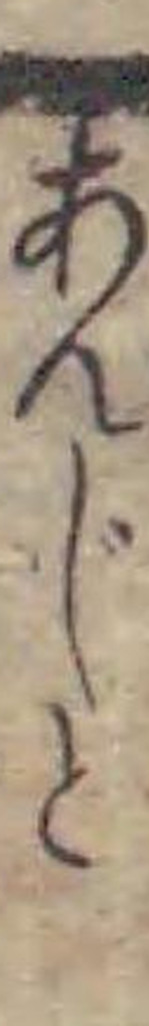あんじと
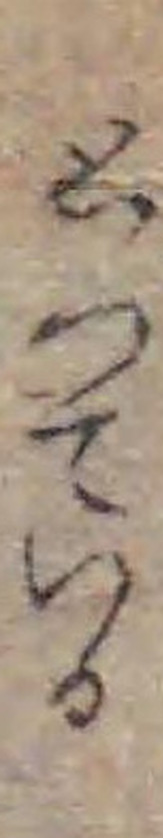思つている
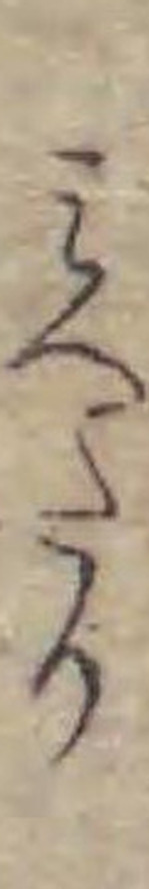みへたり
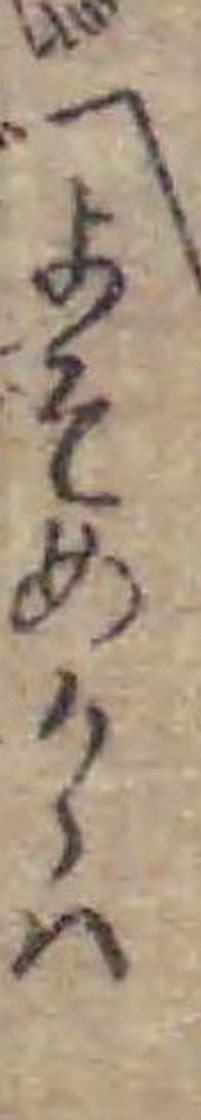〽よそめからは
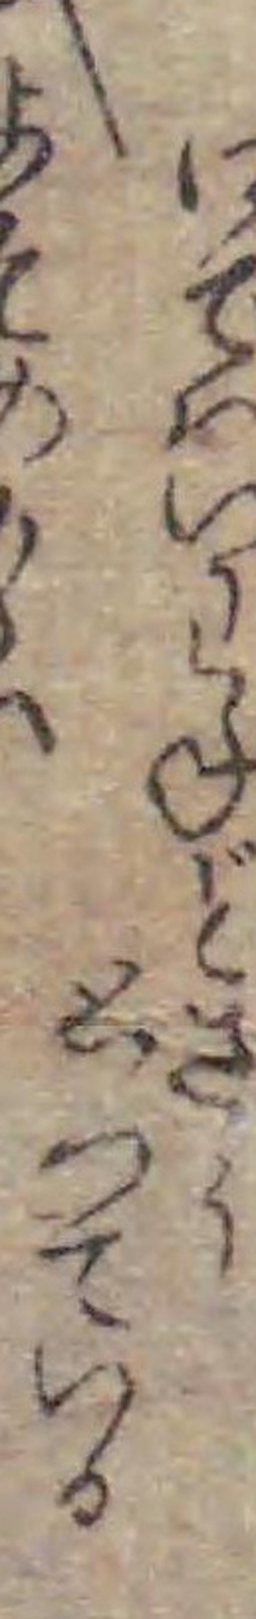〽よそめからは
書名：奇妙頂礼胎錫杖 : 3巻
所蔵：国立国会図書館 National Diet Library, JAPAN
